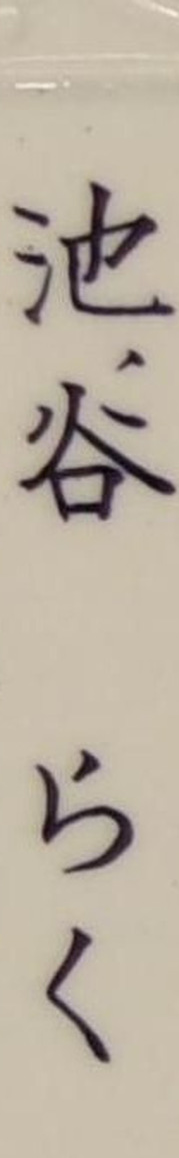池谷らく
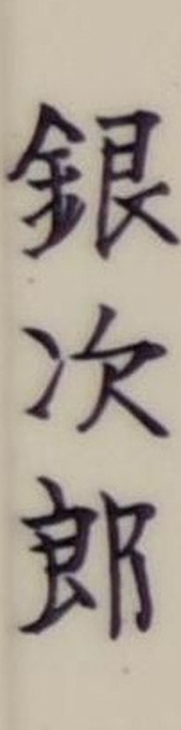銀次郎

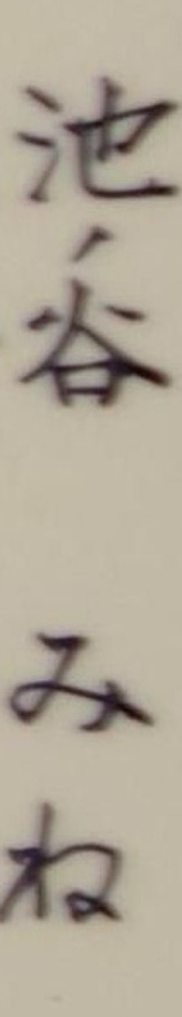池ノ谷みね
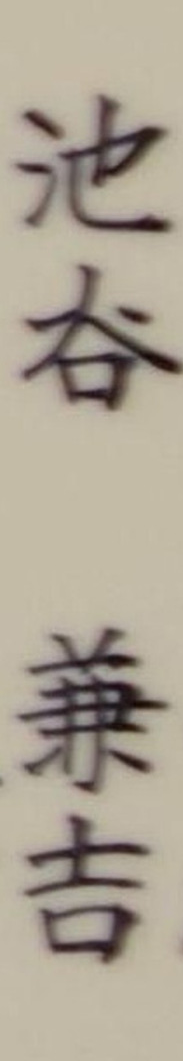池谷兼吉
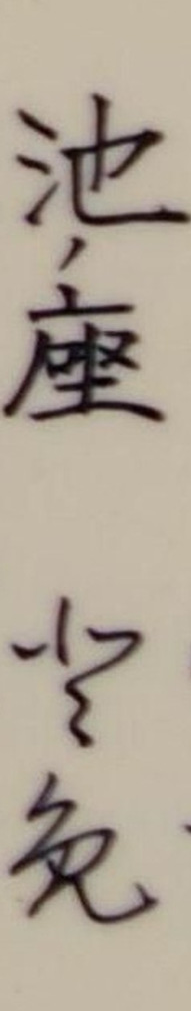池ノ座とめ
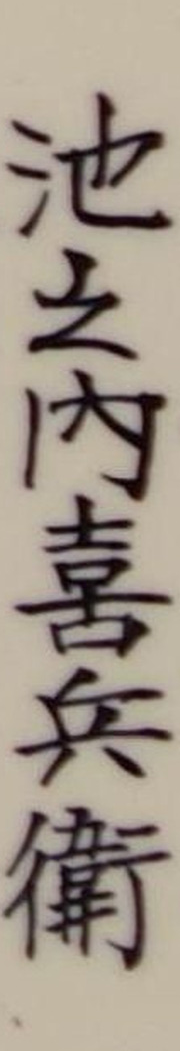池之内喜兵衛
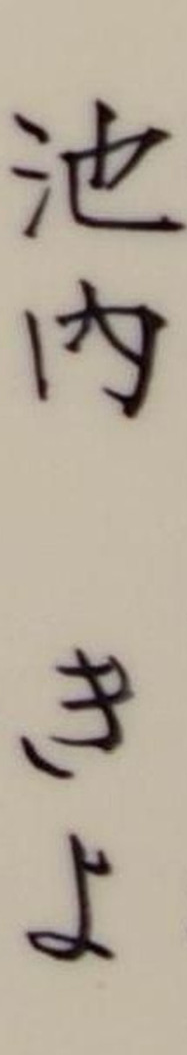池内きよ
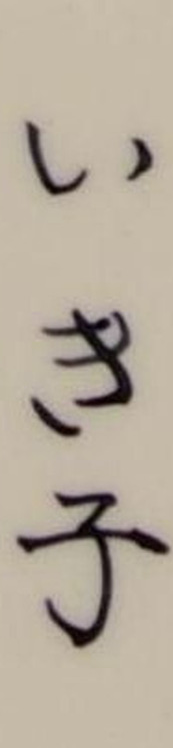いき子
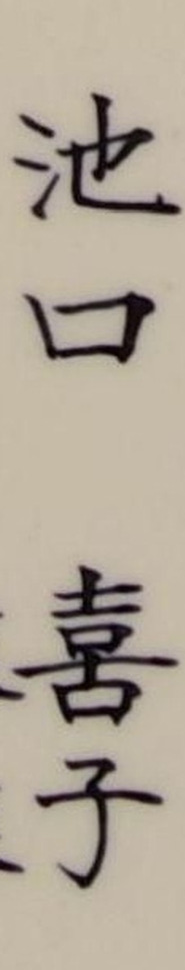池口喜子
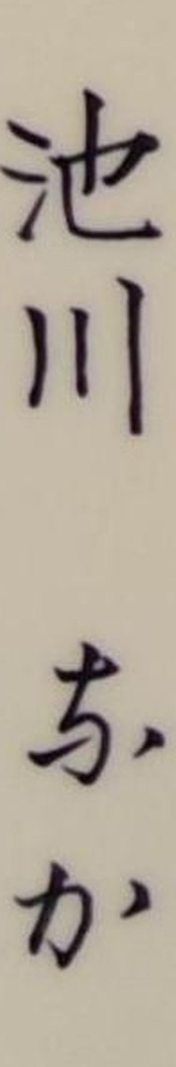池川なか
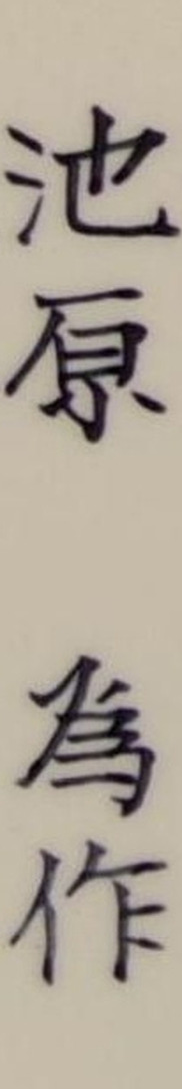池原為作
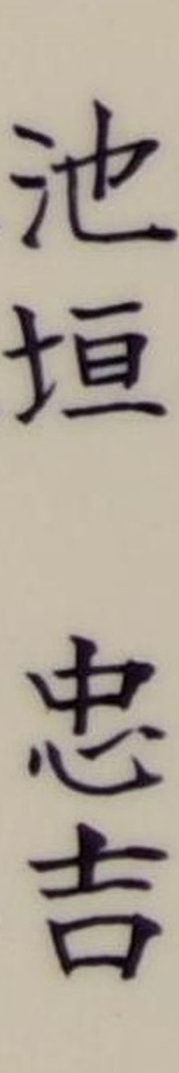池垣忠吉
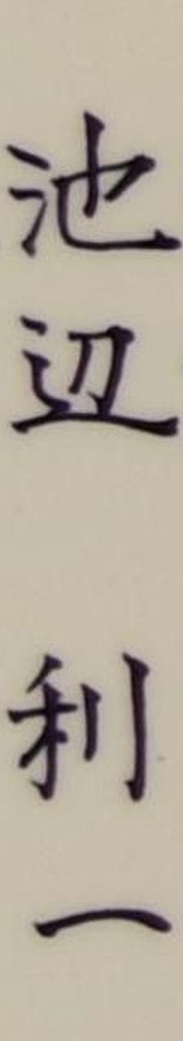池辺利一
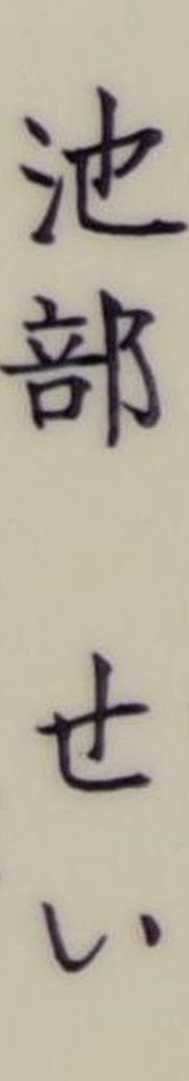池部せい

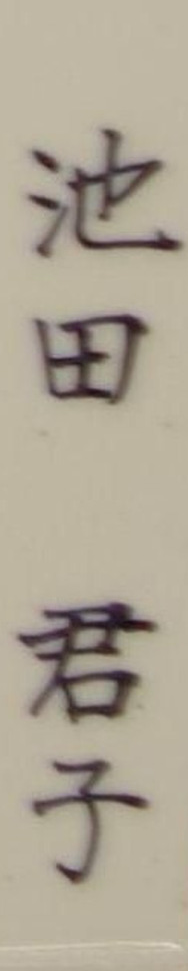池田君子
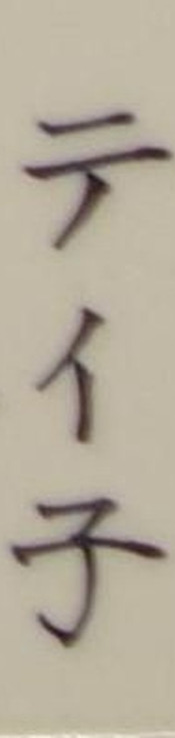テイ子
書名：M~S
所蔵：高野山金剛峯寺
